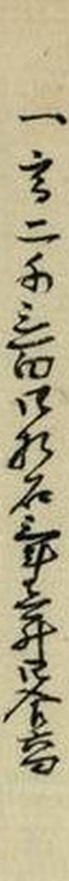一高二千三百四拾石三斗壱升四合六勺同断
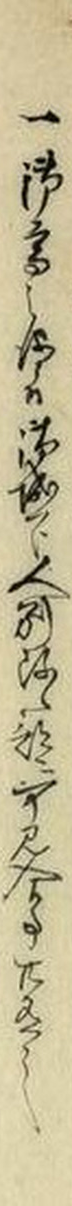一御高之儀ニ付御城下人別改之部ニ可見合事共有之
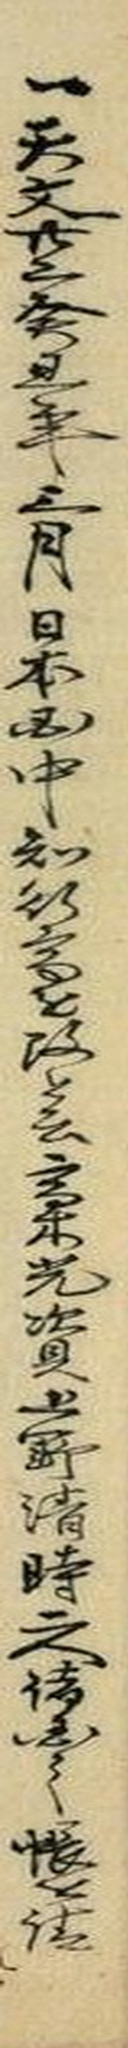一天文廿二癸丑年三月日本国中知行高を改と言高木光資上野清時二人諸国之帳を請
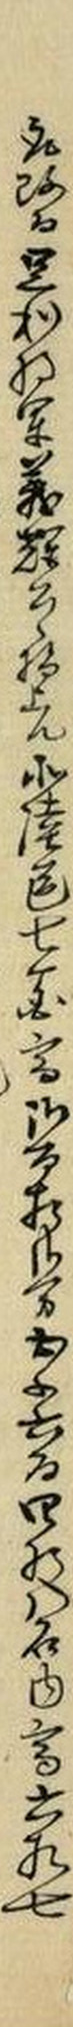取改而足利将軍義輝公へ指上ル北陸道七ケ国高弐百拾弐万五千六百四拾八石内高六拾七
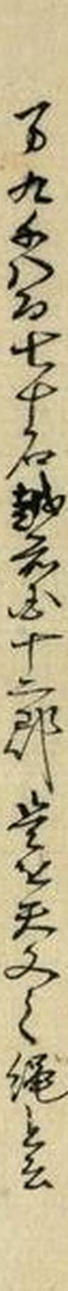万九千八百七十石越前国十二郡是を天文之縄と言
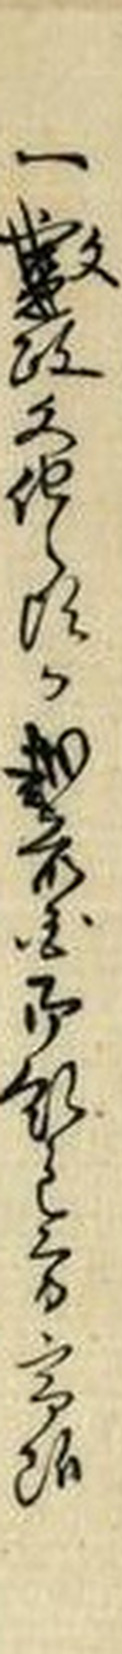一文政文化之頃越前国御領主方高附
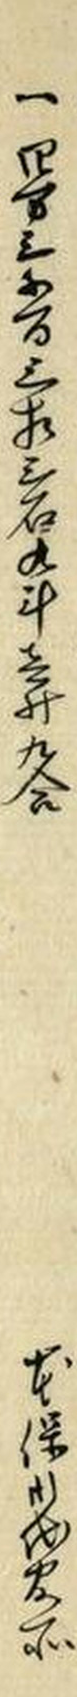一四万三千百三拾三石九斗壱升九合本保御代官所
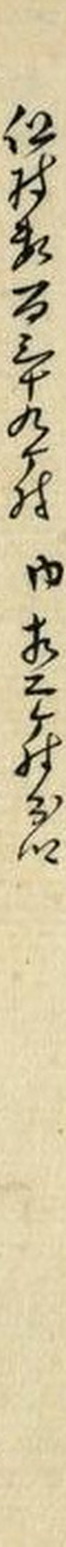但村数百三十九ケ村内拾二ケ村分郷
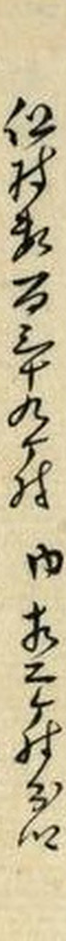但村数百三十九ケ村内拾二ケ村分郷
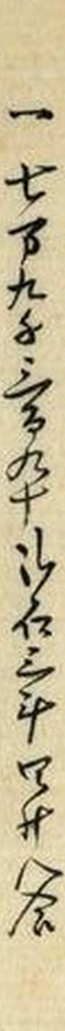一七万九千三百九十弐石三斗四升八合御預所
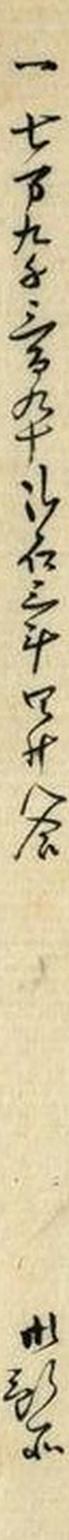一七万九千三百九十弐石三斗四升八合御預所
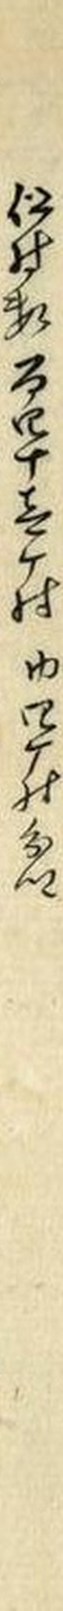但村数百四十壱ケ村内四ケ村分郷
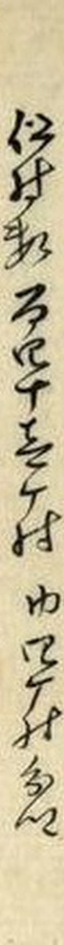但村数百四十壱ケ村内四ケ村分郷
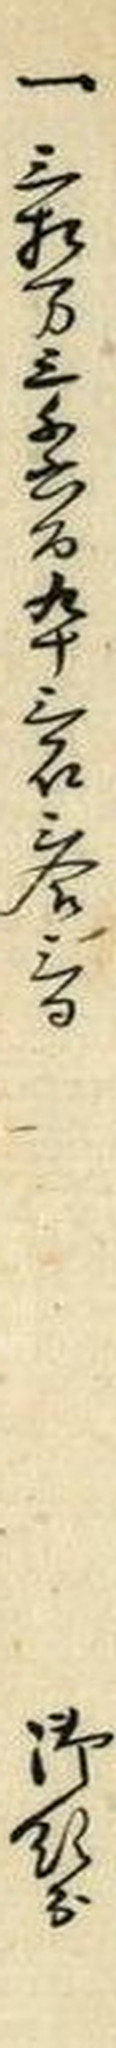一三拾万三千六百九十三石三合三勺御領分
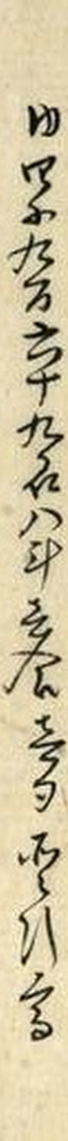内四千九百六十九石八斗壱合壱勺所々引高
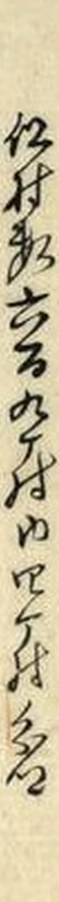但村数六百九ケ村内四ケ村分郷
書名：御国他国諸事之部
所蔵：福井県文書館 Fukui Prefectural Archives
